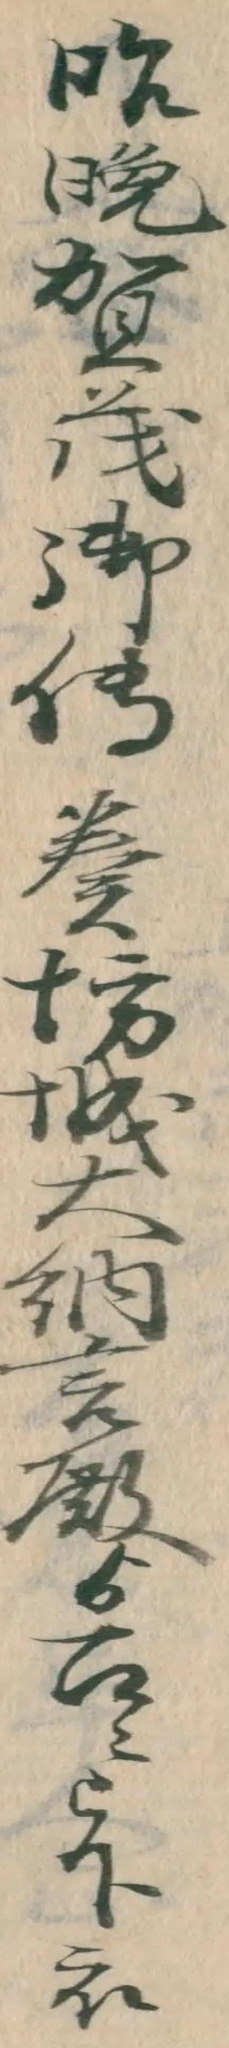昨晩賀茂御伝奏坊城大納言殿ゟ召ニ被下被
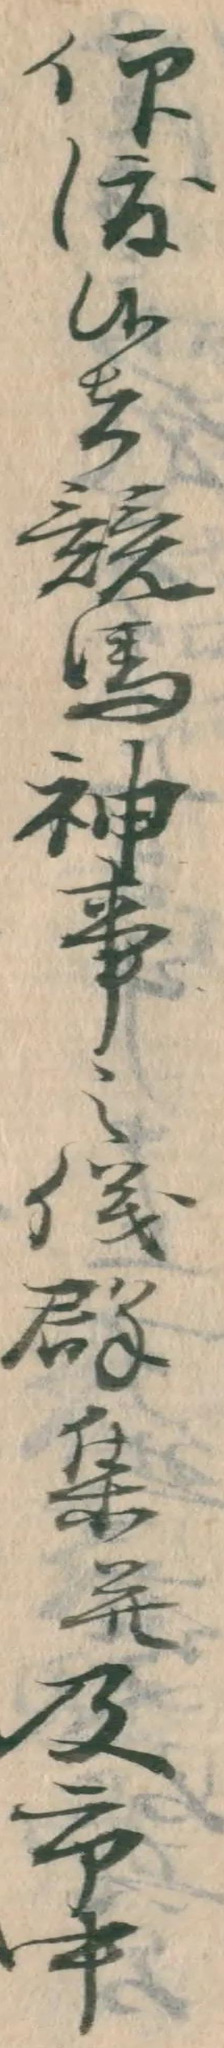仰渡候者競馬神事之儀群集并及市中
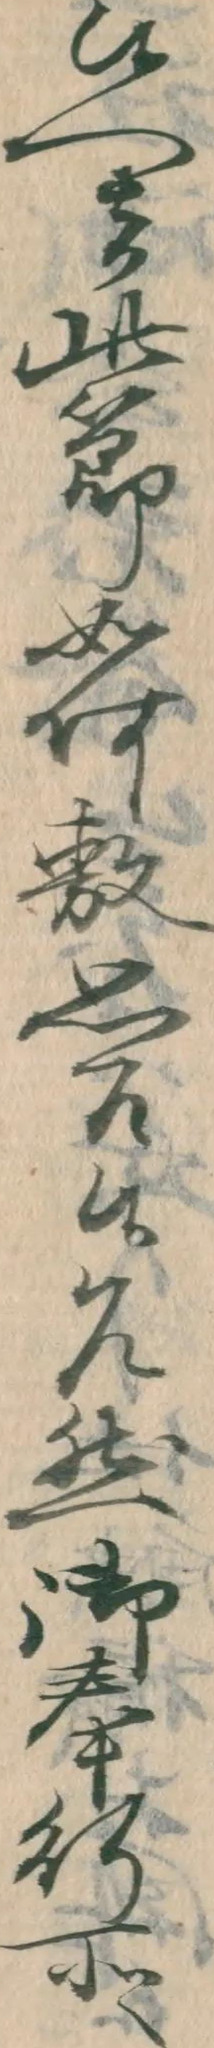候へ者此節如何敷思召候乍然御奉行所へ
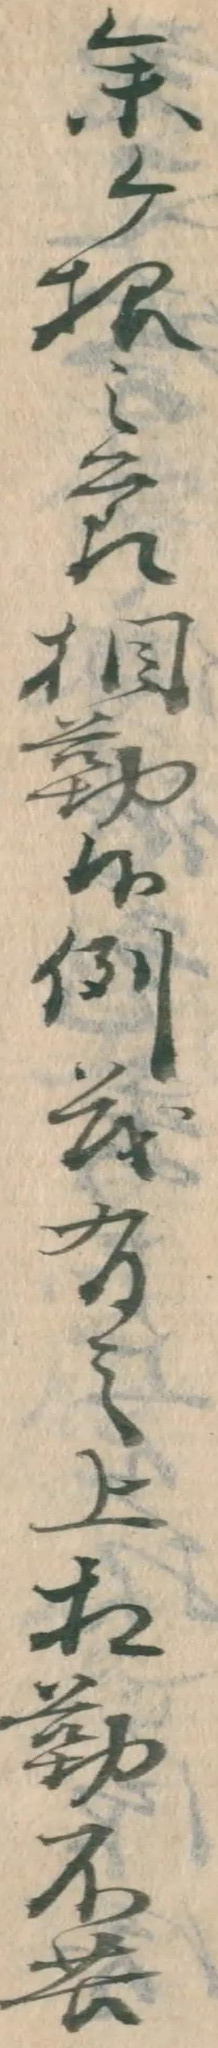参ケ様之節相勤候例茂有之上相勤不苦
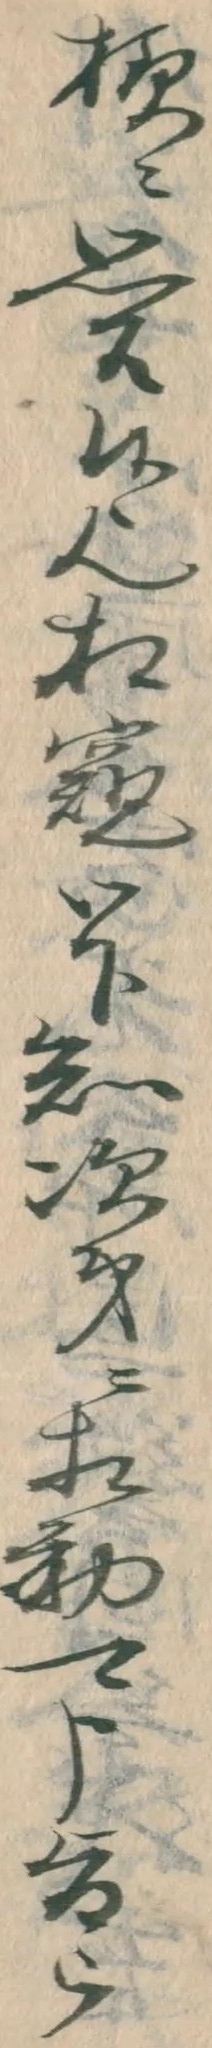様ニ思召候也相窺御下知次第ニ相勤可申旨被
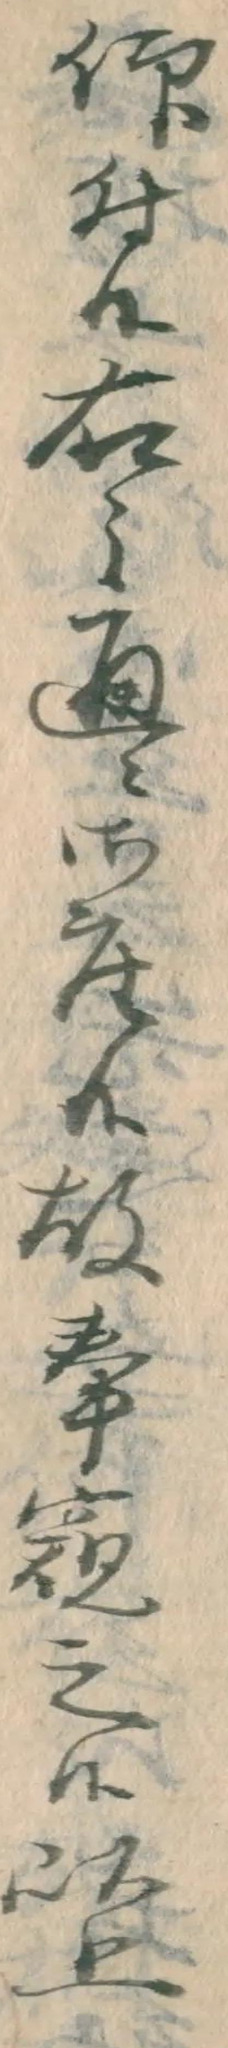仰付候右之通ニ御座候故奉窺之候以上

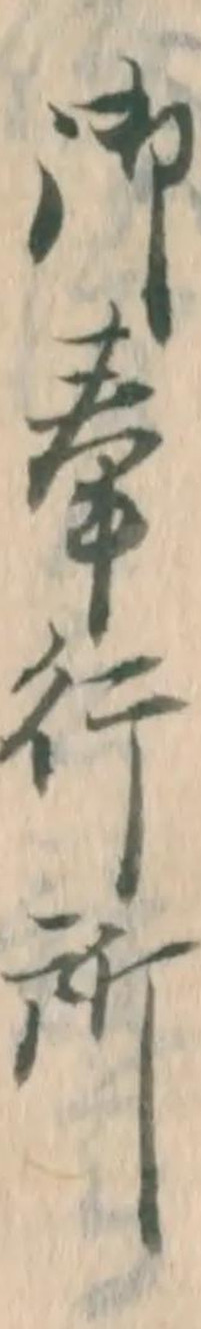御奉行所
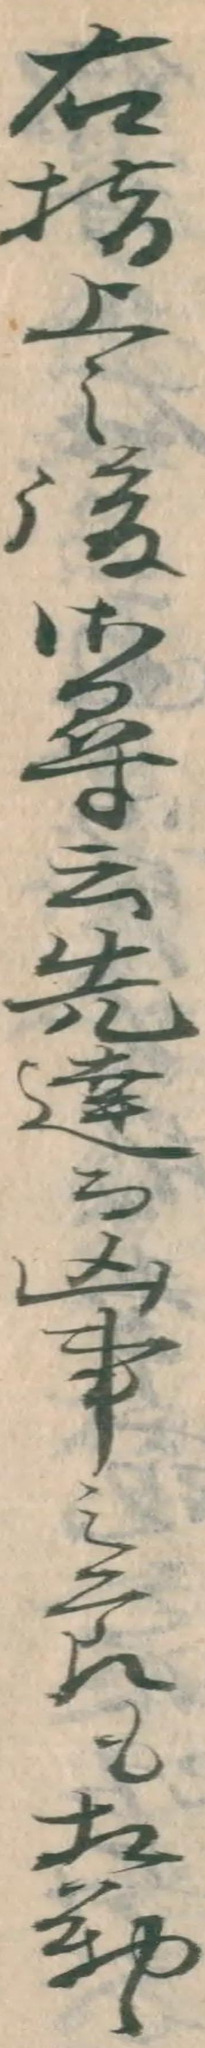右指上之後御尋云先達而凶事之節も相勤候
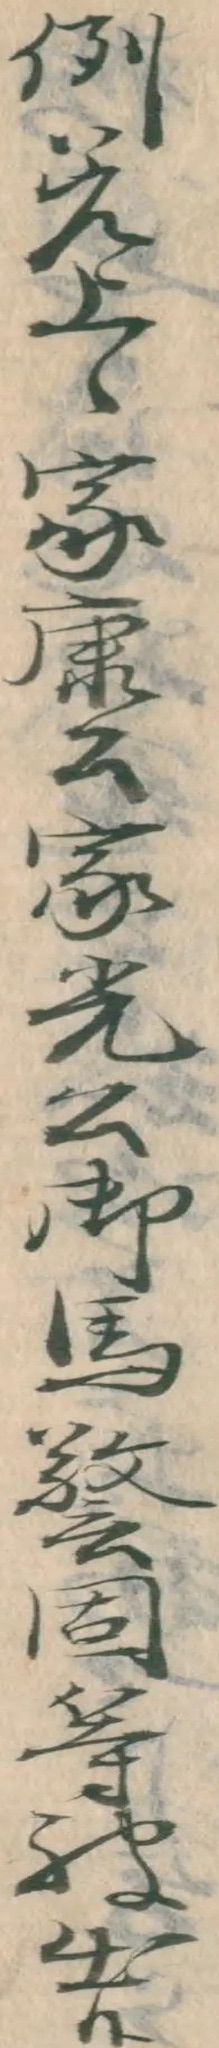例差上候家康公家光公御馬警固等被出候
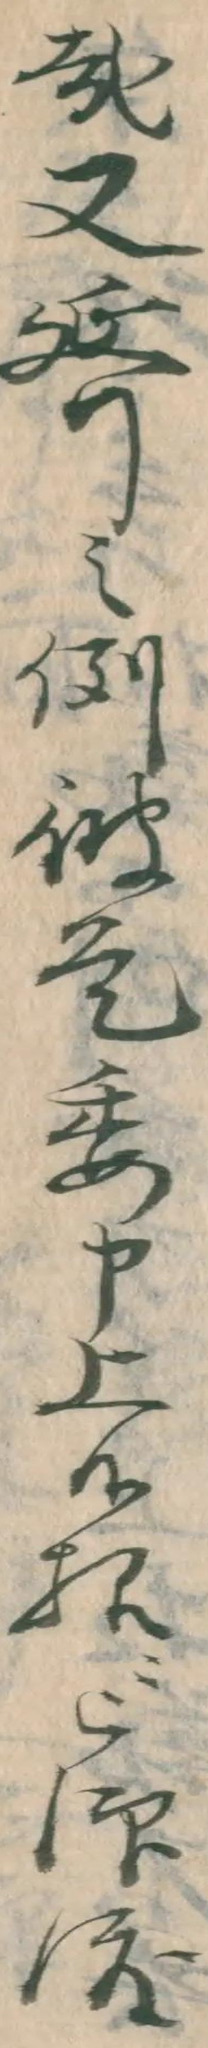哉又延引之例彼是委申上候様ニ被仰渡
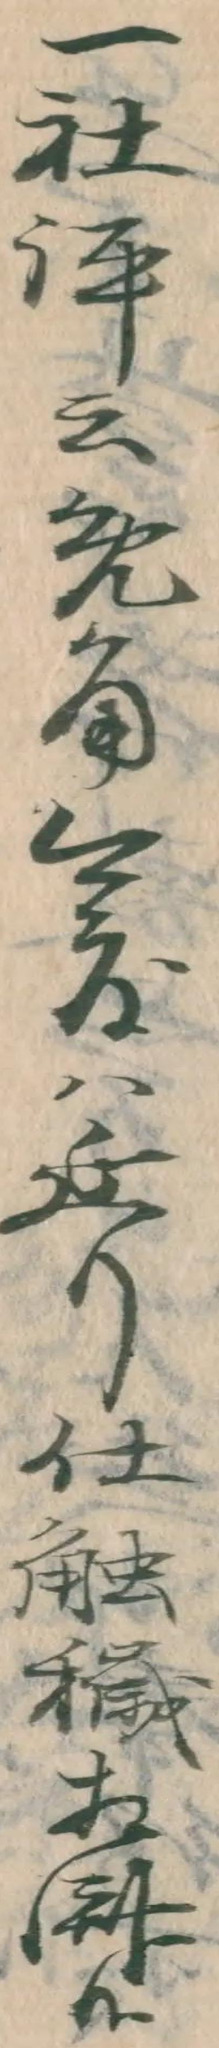一社評云兎角今度ハ延引仕触穢相済候
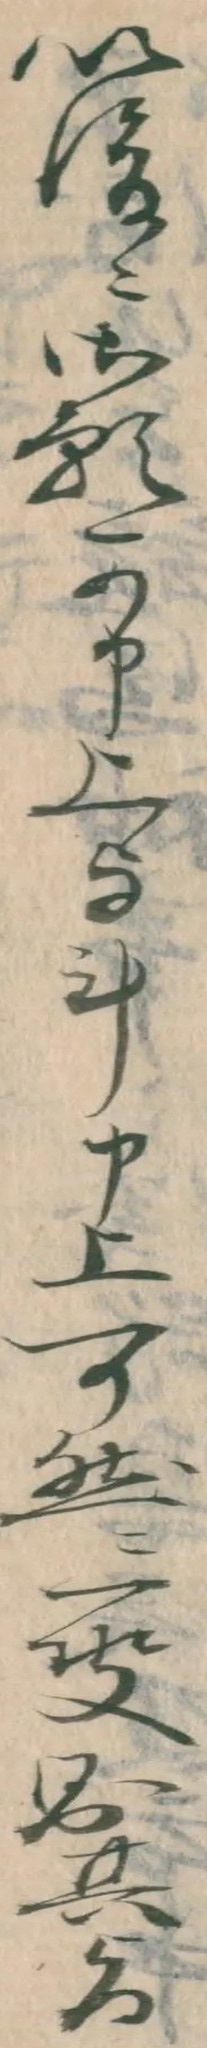以後ニ御願可申上与計申上可然ニ一決則其旨
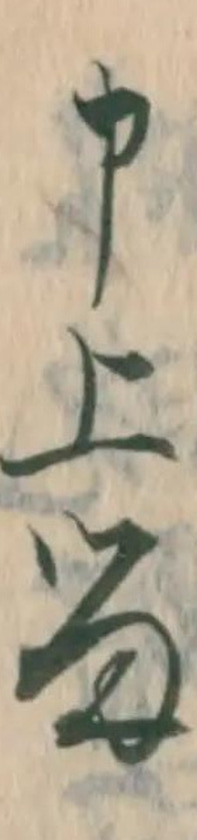申上留
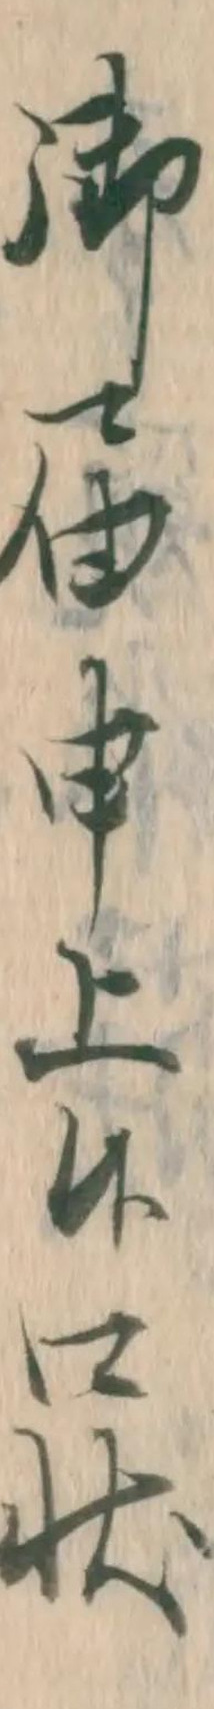御届申上候口状
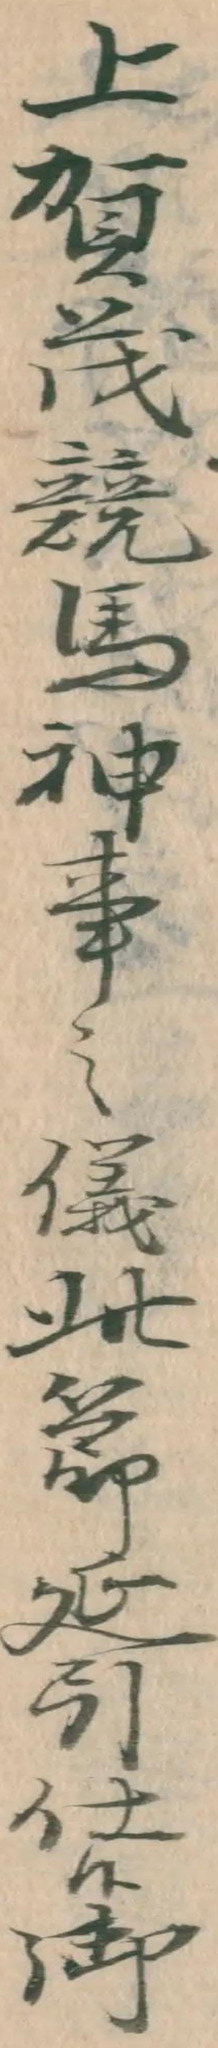上賀茂競馬神事之儀此節延引仕候御
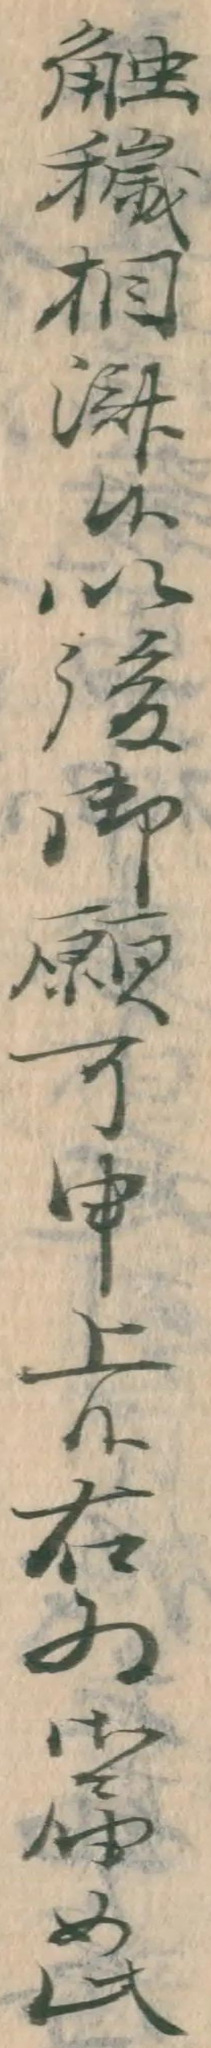触穢相済候以後御願可申上候右為御届如此
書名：賀茂社記録. 第10冊
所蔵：国立国会図書館 National Diet Library, JAPAN
